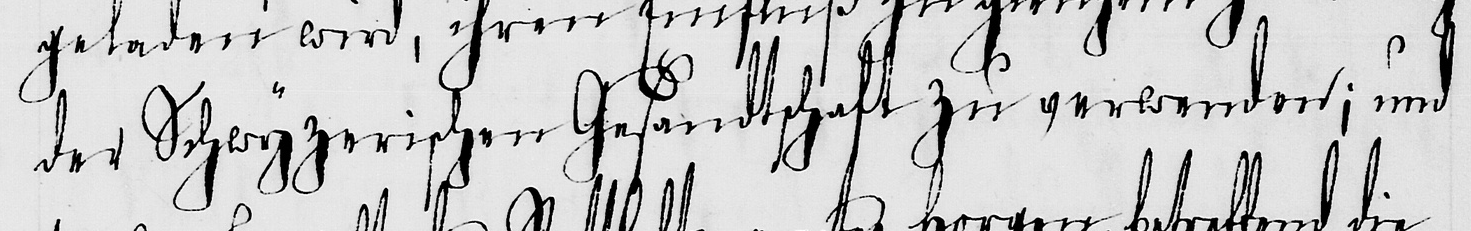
der Schwyzerischen Gesandtschaft zu verwenden; und
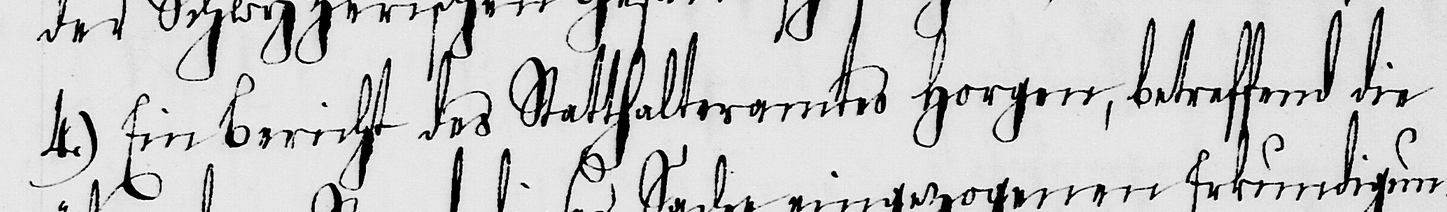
4.) Ein Bericht des Statthalteramtes Horgen, betreffend die
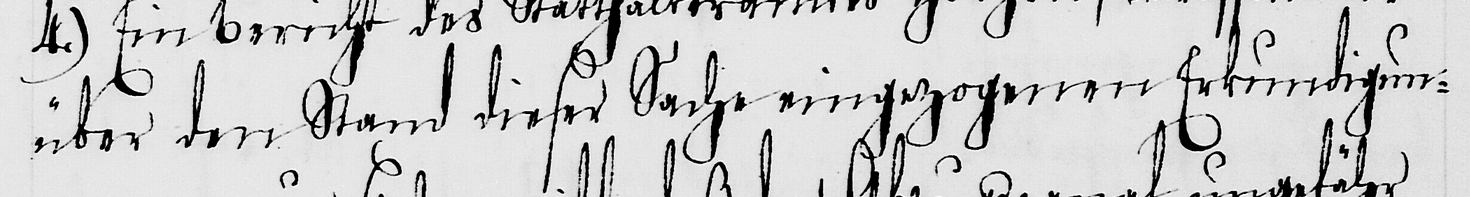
über den Stand dieser Sache eingezogenen Erkundigun¬
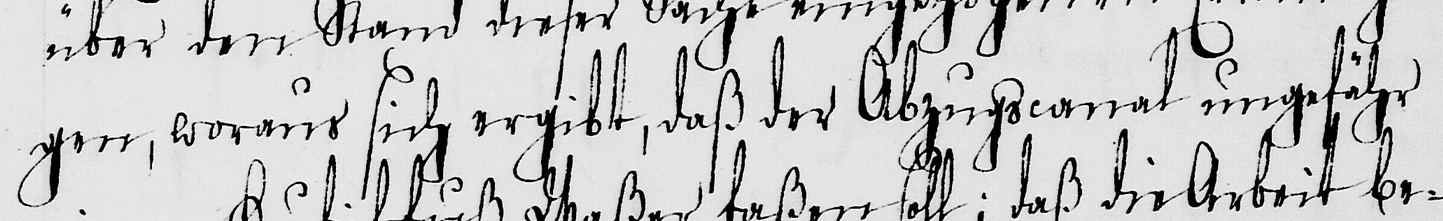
gen, woraus sich ergibt, daß der Abzugscanal ungefähr
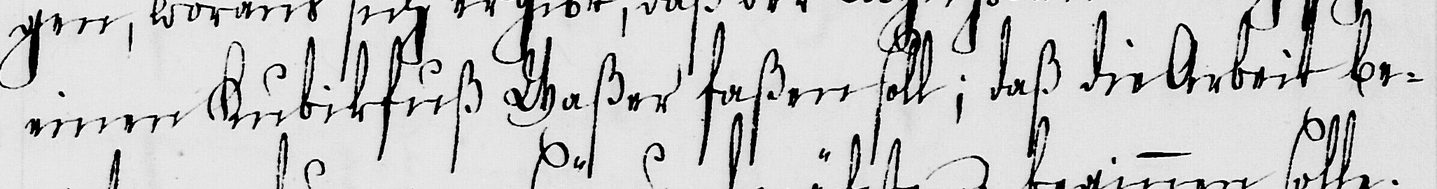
einen Kubikfuß Waßer faßen soll; daß die Arbeit be¬
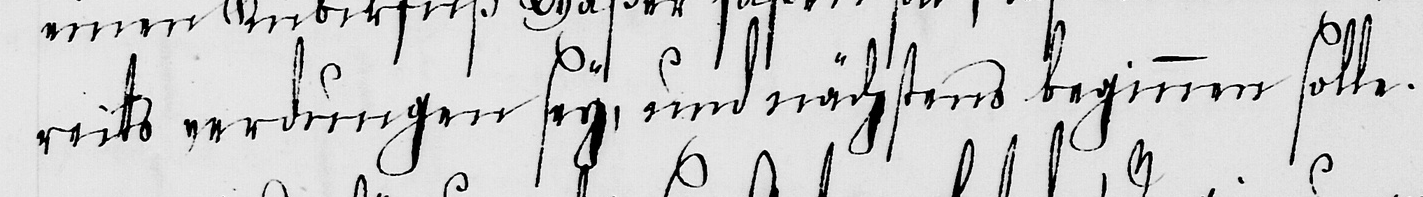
reits verdungen sey, und nächstens beginnen solle.
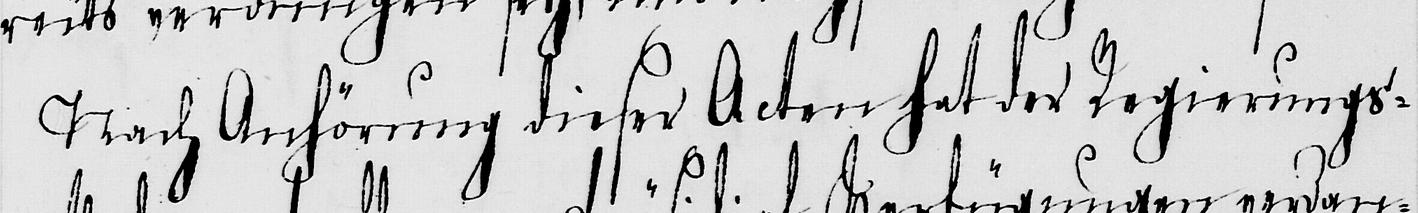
Nach Anhörung dieser Acten hat der Regierungs¬
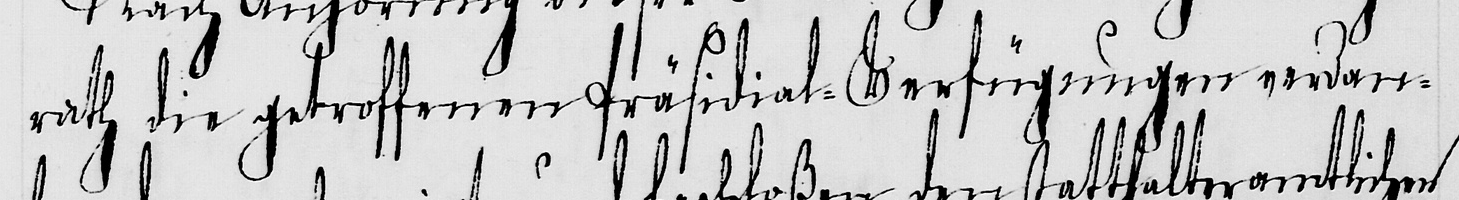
rath die getroffenen Präsidial-Verfügungen verdan¬
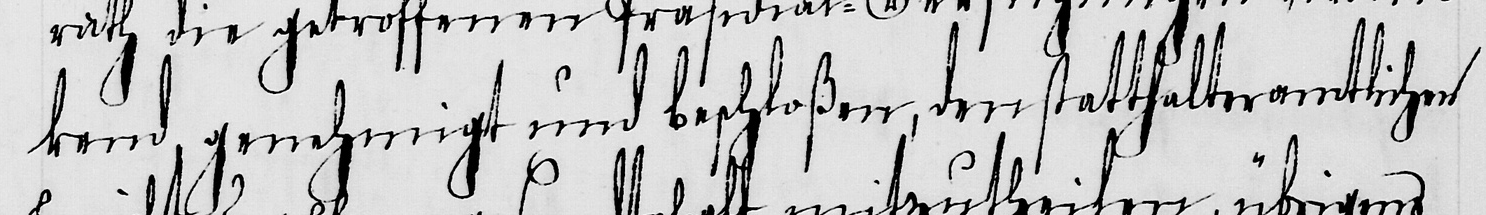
kend genehmigt und beschloßen, den statthalteramtlich¬
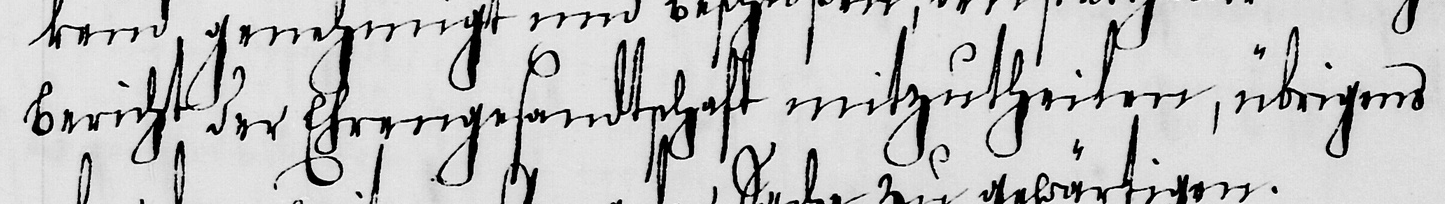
Bericht der Ehrengesandtschaft mitzutheilen, übrigens
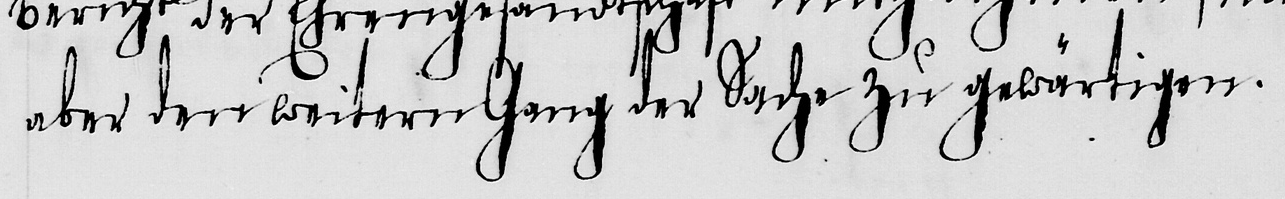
aber den weitern Gang der Sache zu gewärtigen.
